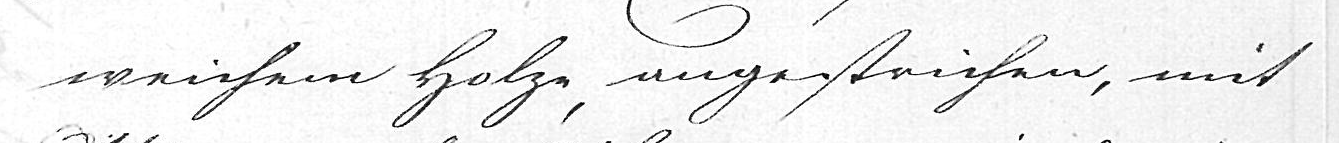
weichem Holze, angestrichen, mit
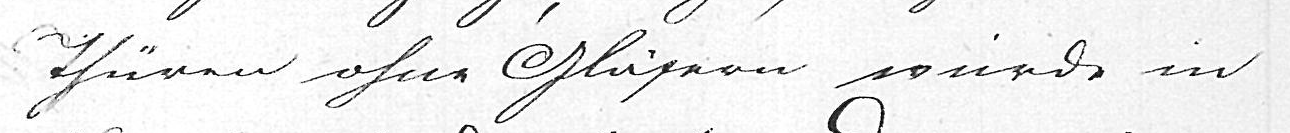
Thüren ohne Gläsern würde in
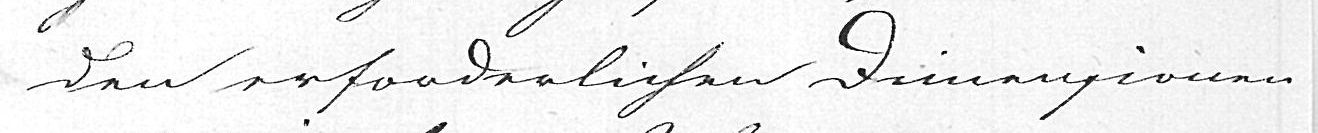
den erforderlichen Dimensionen
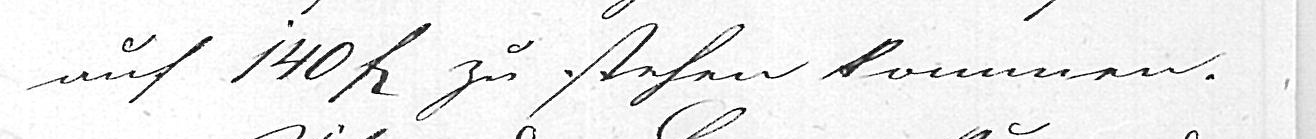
auf 140 fl zu stehen kommen.
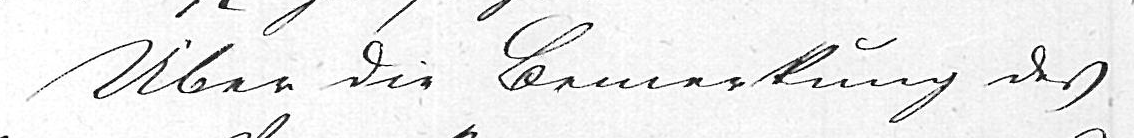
Über die Bemerkung des
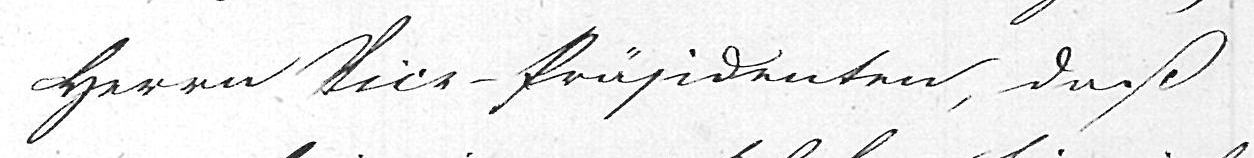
Herrn Vice-Präsidenten, daß
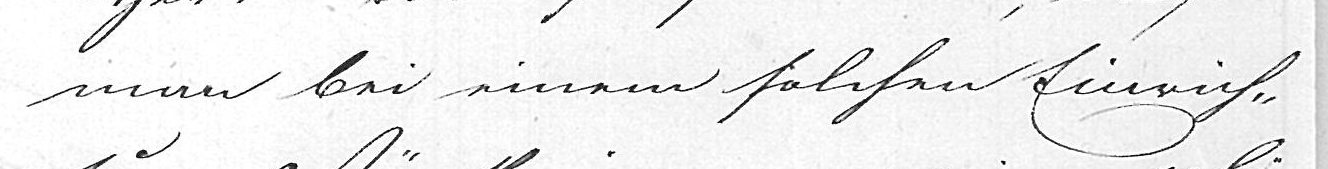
man bei einem solchen Einrich-
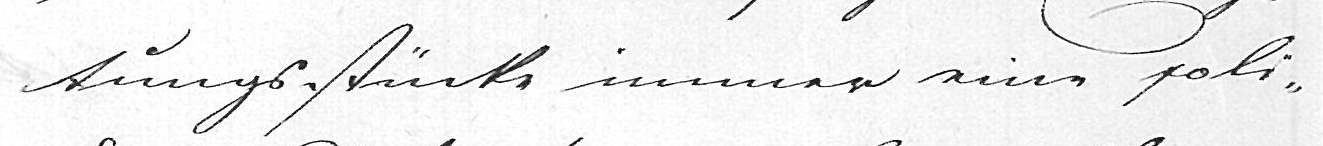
tungsstücke immer eine soli-
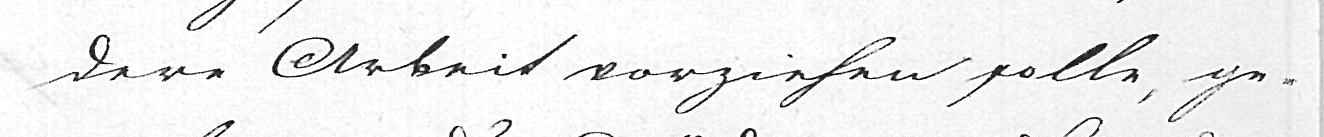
dere Arbeit vorziehen solle, ge-
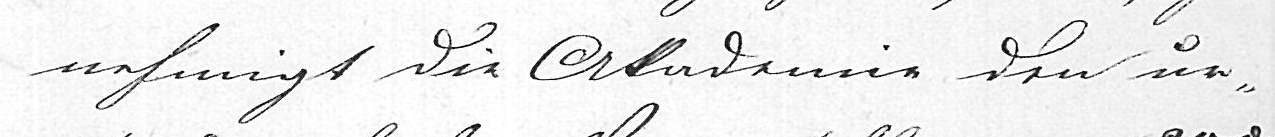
nehmigt die Akademie den ur-
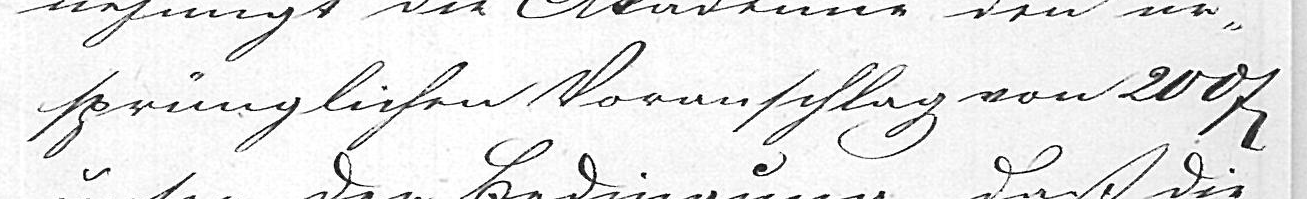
sprünglichen Voranschlag von 200 fl
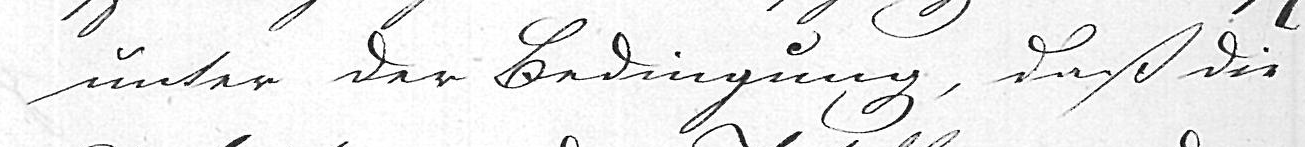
unter der Bedingung, daß die
